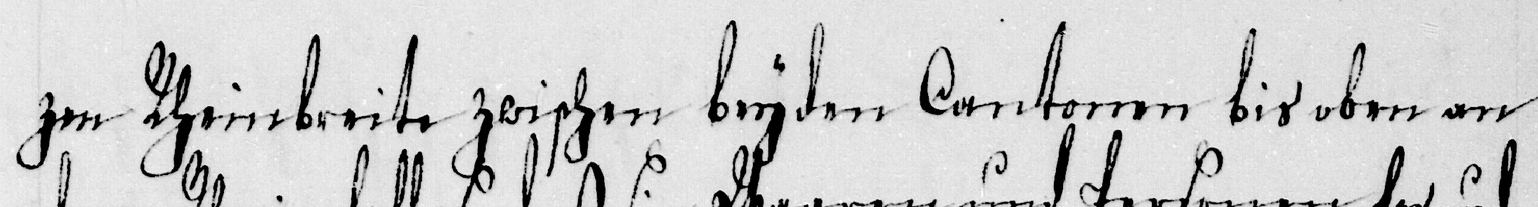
zen Rheinbreite zwischen beyden Cantonen bis oben an
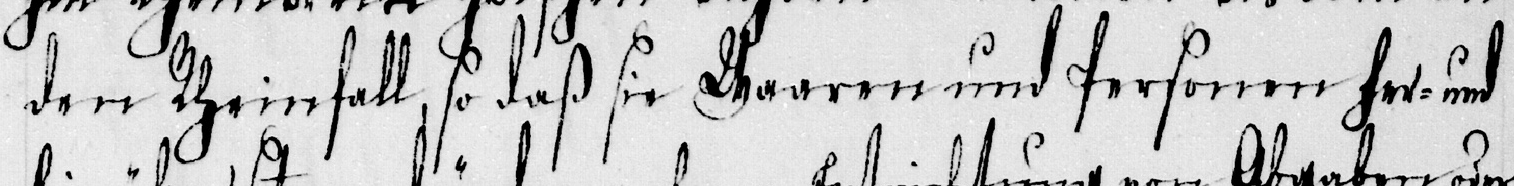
den Rheinfall, so daß sie Waaren und Personen her- und
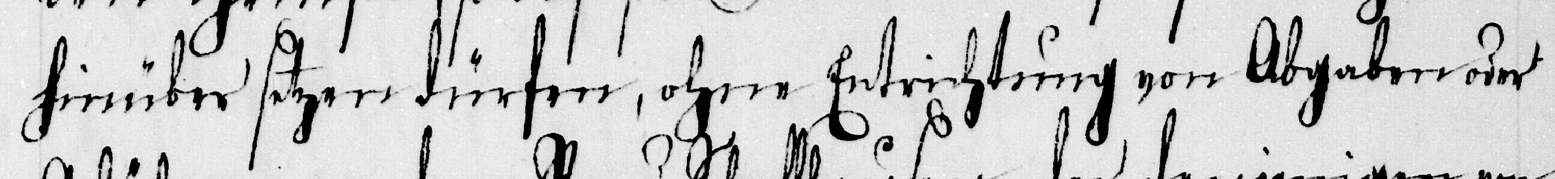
hinübersetzen dürfen, ohne Entrichtung von Abgaben oder
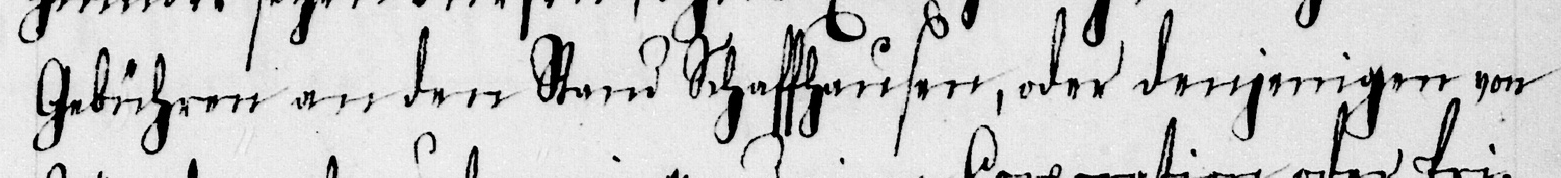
Gebühren an den Stand Schaffhausen, oder denjenigen von
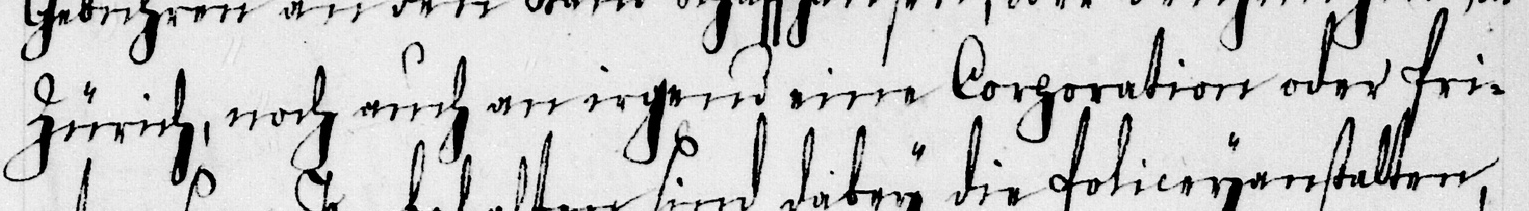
Zürich, noch auch an irgend eine Corporation oder Pri¬
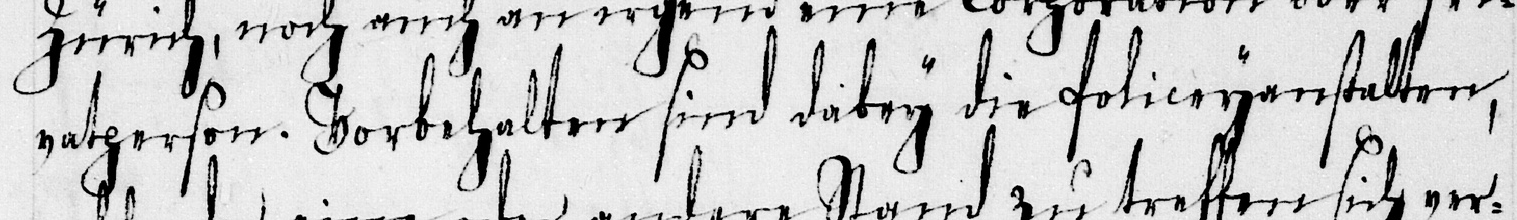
vatperson. Vorbehalten sind dabey die Policeyanstalten,
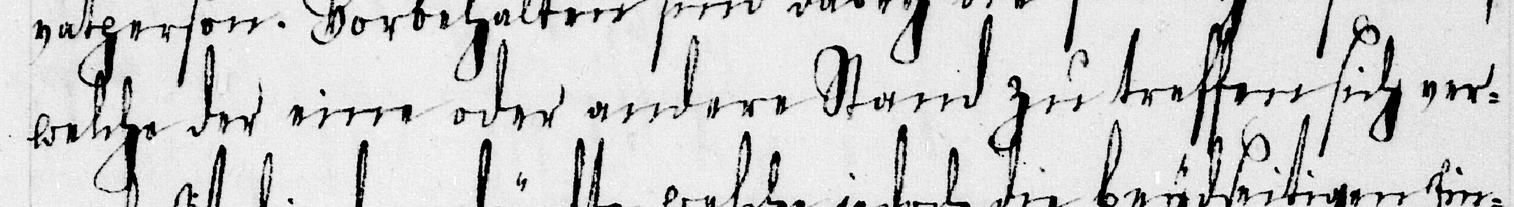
welche der eine oder andere Stand zu treffen sich ver¬
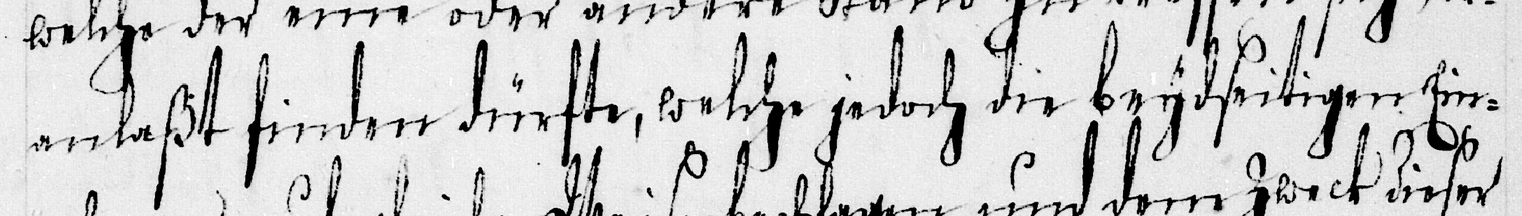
anlaßt finden dürfte, welche jedoch die beydseitigen Ein¬
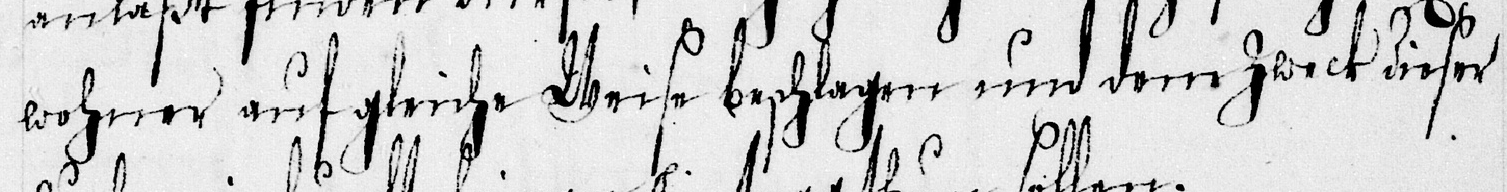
wohner auf gleiche Weise beschlagen und dem Zweck dieser
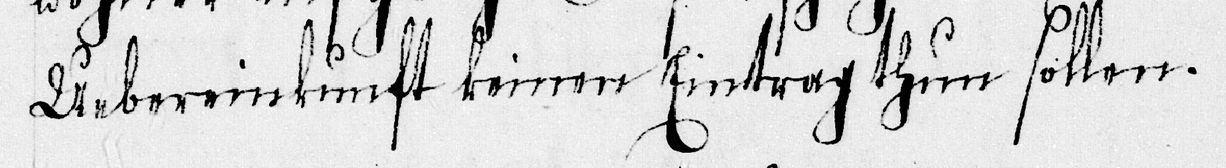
Uebereinkunft keinen Eintrag thun sollen.
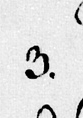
3.
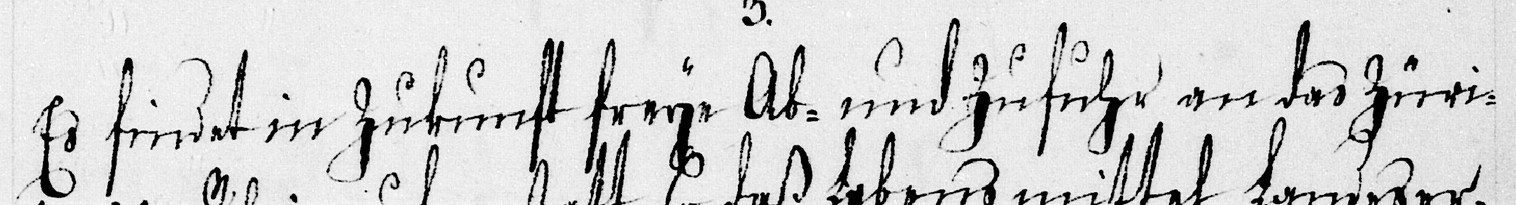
Es findet in Zukunft freye Ab- und Zufuhr an das Züri¬
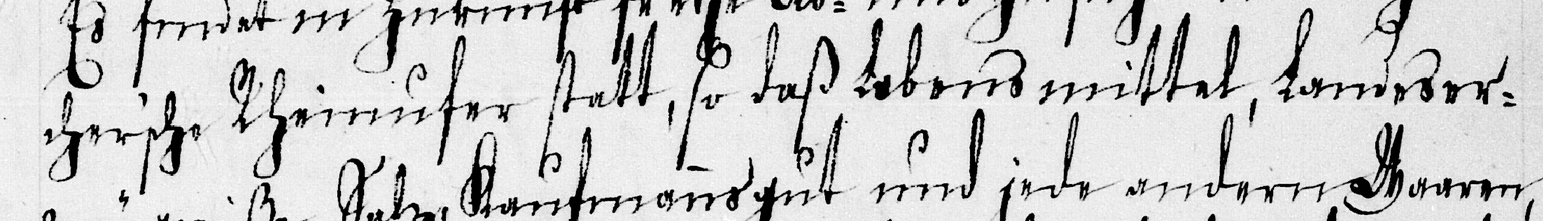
cherische Rheinufer statt, so daß Lebensmittel, Landeser¬
